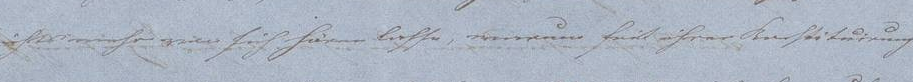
nichts mehr von sich hören lasse, warum seit ihrer Konstituirung
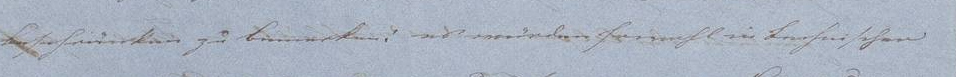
beschränken zu bemerken: es würden sowohl in technischer
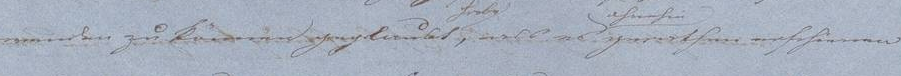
verwenden zu können geglaubt habe, als es ohnehin gerathen erschienen
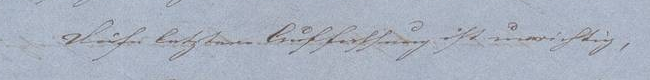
Diese letztere Auffassung ist unrichtig,
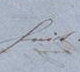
heit
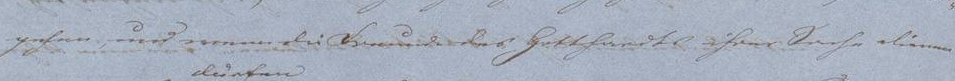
gehen, und wenn die Freunde des Gotthardts ihrer Sache dienen
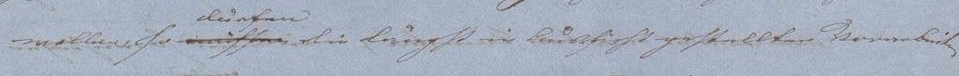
wollen, so müssendürfen die längst in Aussicht gestellten Vorarbeiten
